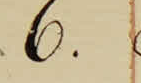6.
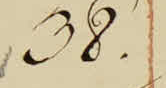38.
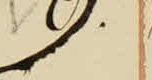9.
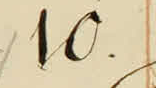10.
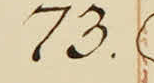73.
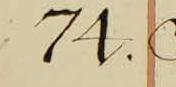74.
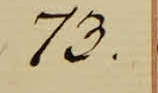73.
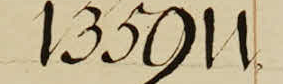135911
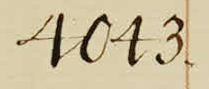4043
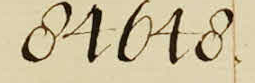84648
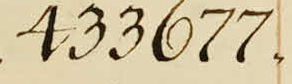433677
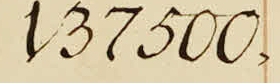137500
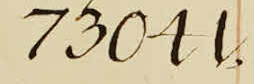73041
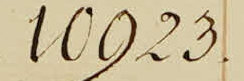10923
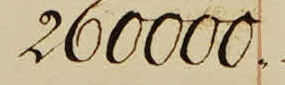260000
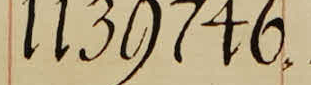1139746
